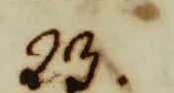23.
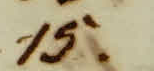15.
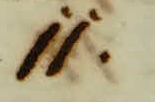11.
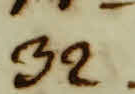32
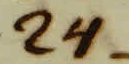24
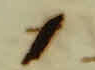1
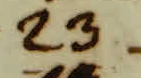23
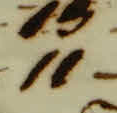11
